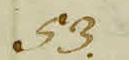53.
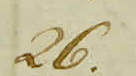26.
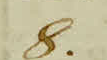8.
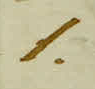1.
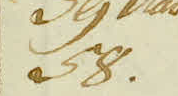58.
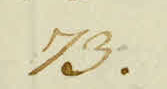73.
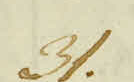31.
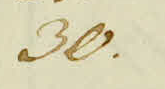30.
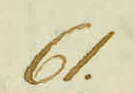61.
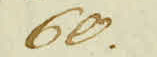60.
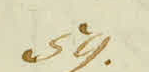59.
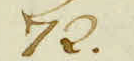72.
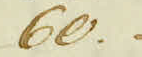60.
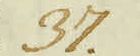37.
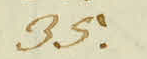35.
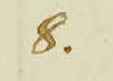8.
